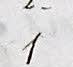1
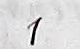1
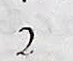2
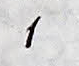1
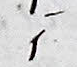1
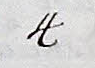4
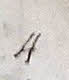4
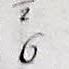6
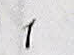1
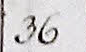36
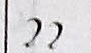22
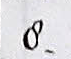8
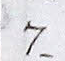7
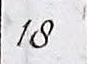18
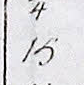15
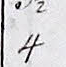4
